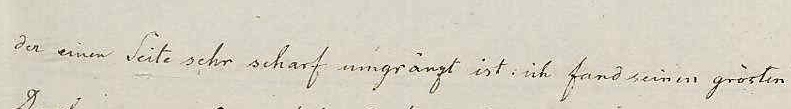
der einen Seite sehr scharf umgränzt ist: ich fand seinen grösten
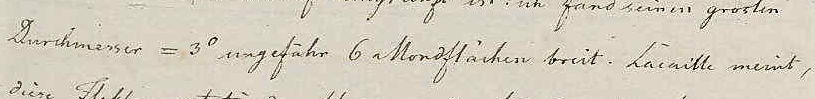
Durchmesser 3° ungefähr 6 Mondflächen breit. Lacaille meint,
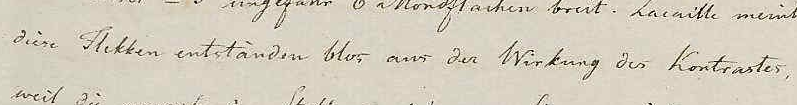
diese Flekken entständen blos aus der Wirkung des Kontrastes,
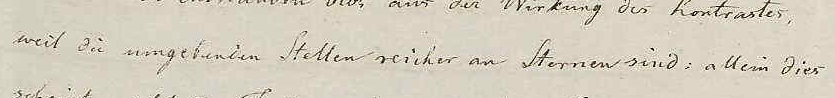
weil die umgebenden Stellen reicher an Sternen sind: allein dies
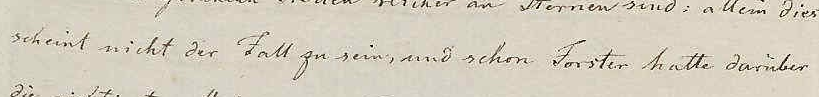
scheint nicht der Fall zu sein, und schon Forster hatte darüber
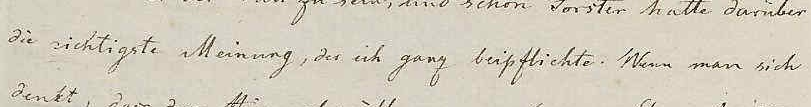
die richtigste Meinung, der ich ganz beipflichtete. Wenn man sich
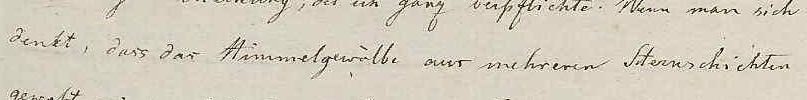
denkt, dass das Himmelgewölbe aus mehreren Sternschichten
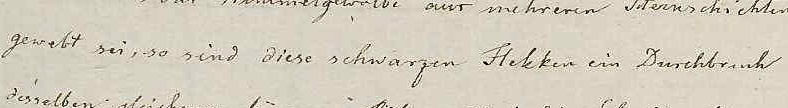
gewebt sei, so sind diese schwarzen Flekken ein Durchbruch
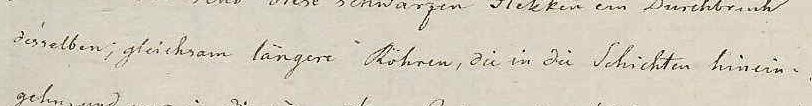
desselben, gleichsam längere Röhren, die in die Schichten hinein-
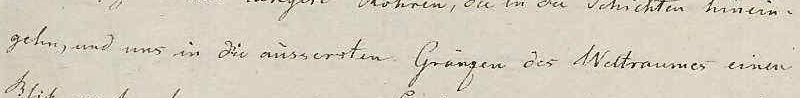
gehn, und uns in die äussersten Gränzen des Weltraumes einen
